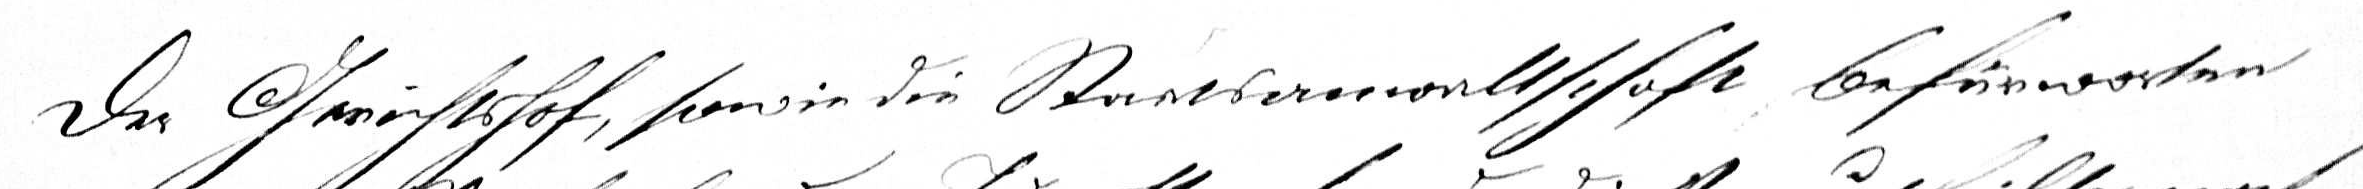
Der Gerichtsfhof, sowie die Staatsanwaltschaft befürworten
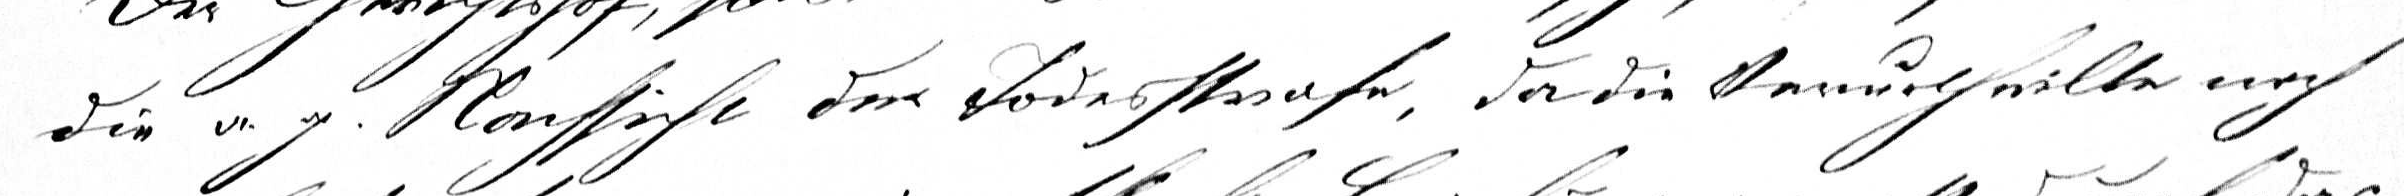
die a. g. Nachsicht der Todesstrafe, da die Verurtheilte noch
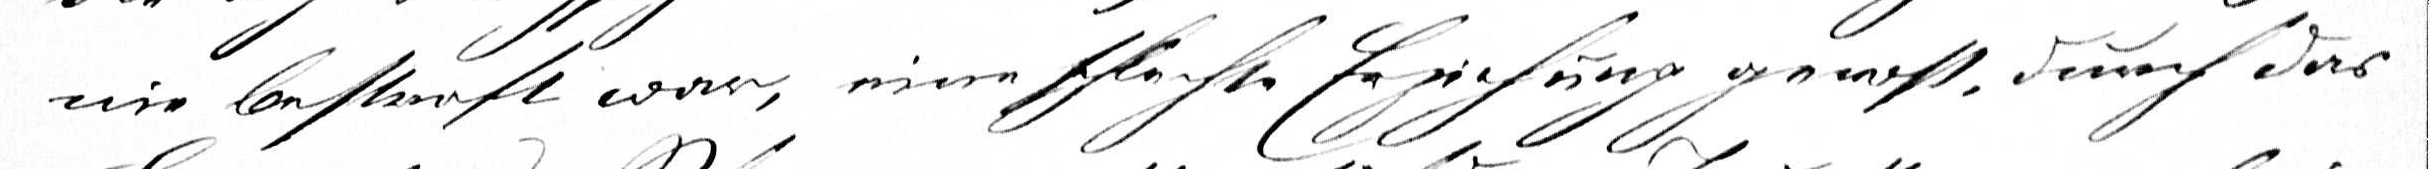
nie bestraft war, eine schlechte Erziehung genoß, durch das
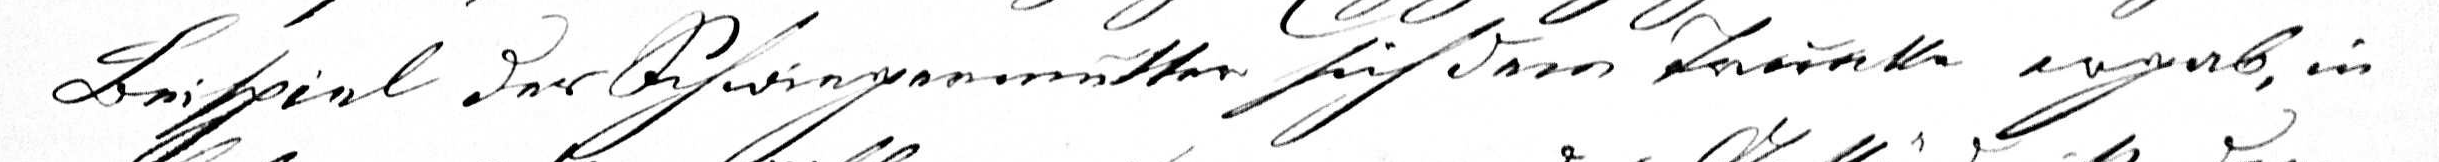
Beispiel der Schwiegermutter sich dem Trunke ergab, in
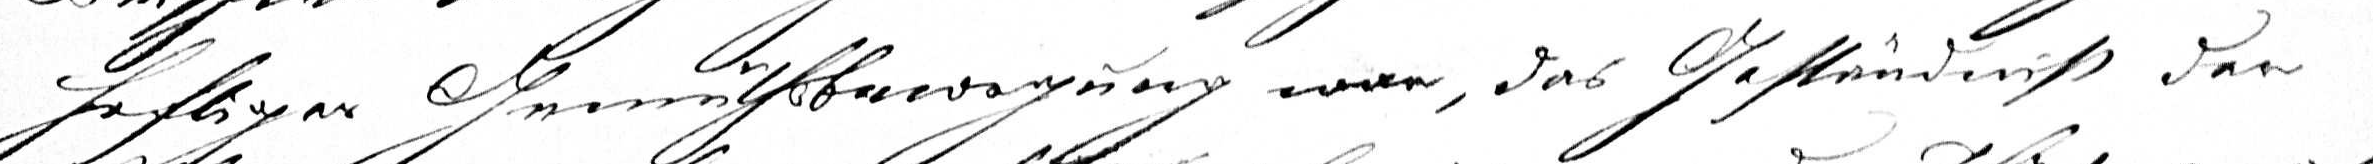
heftiger Gemuthsbewegung war, das Geständnis der
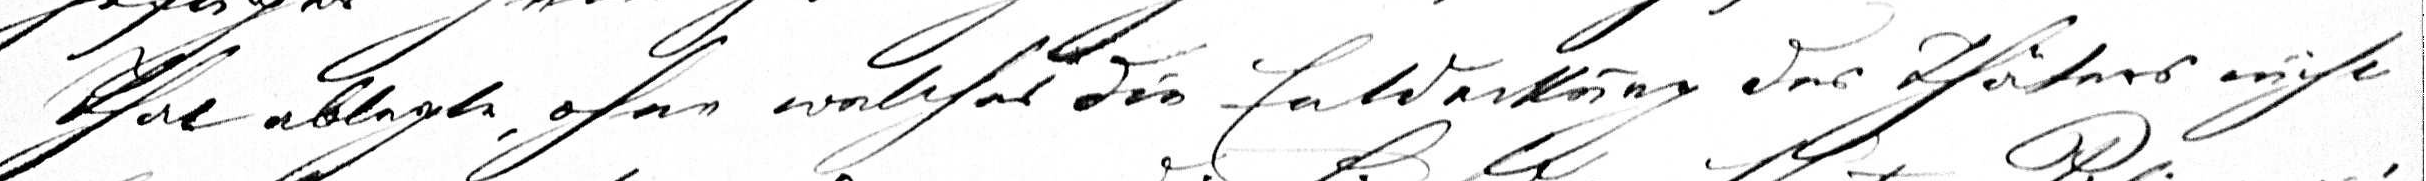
That ablegte, ohne welches die Entdeckung des Thäters nicht
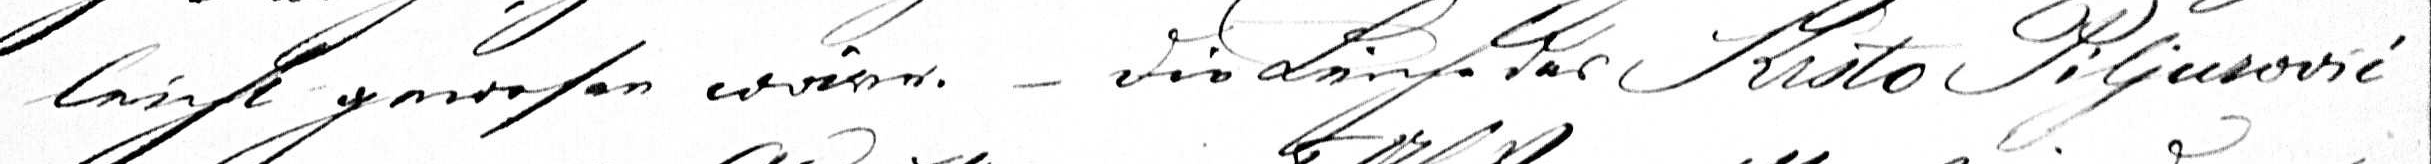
leicht gewesen wäre. Die Leiche des Krsto Piljurović
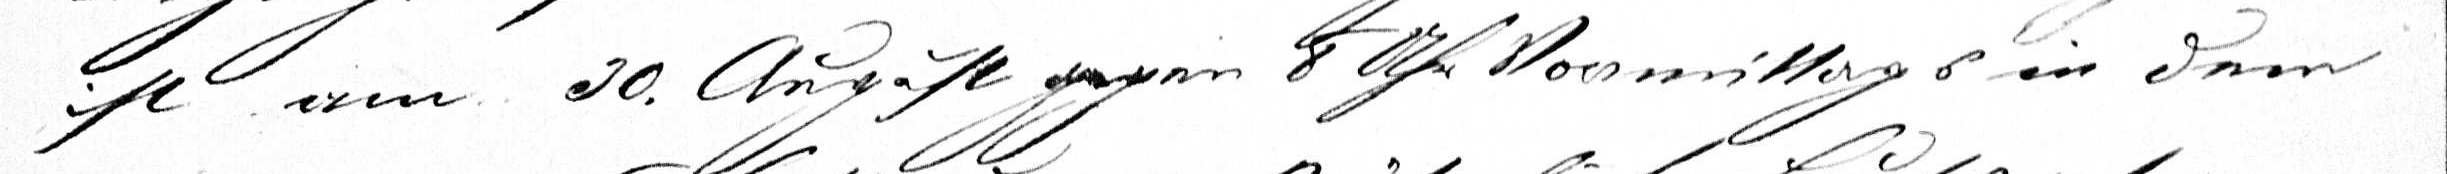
ist am 30. August gegen 8 Uhr Vormittags in dem
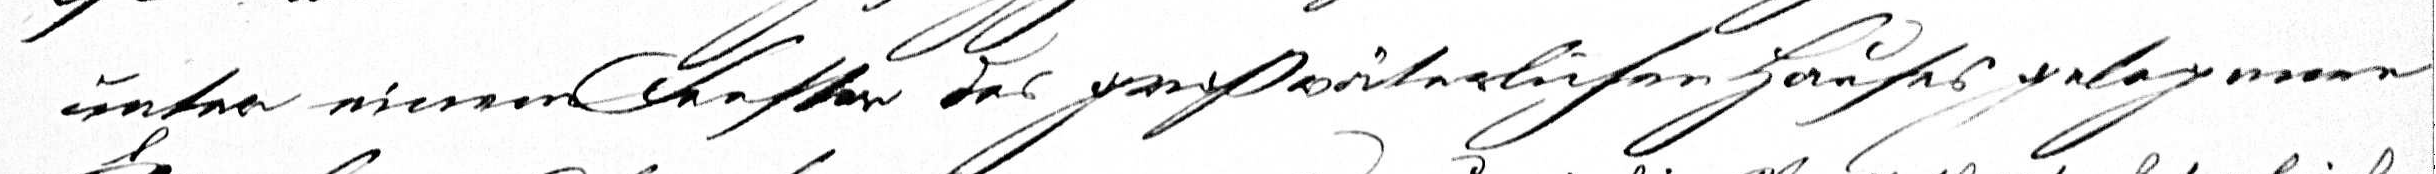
unter einem Fenster des großväterlichen Hauses gelegenen
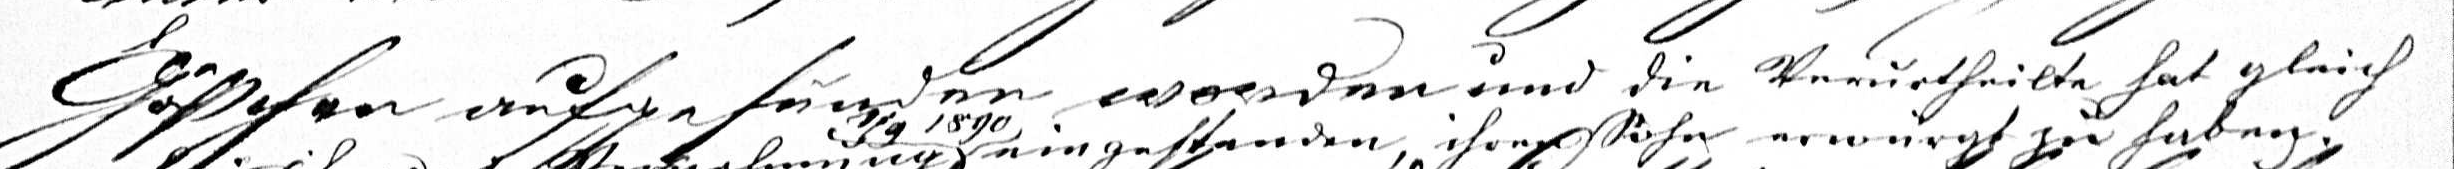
Göp[?]hre aufgefunden worden und die Verurtheilte hat gleich
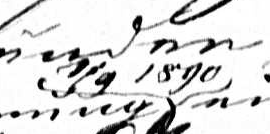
1/9/1890
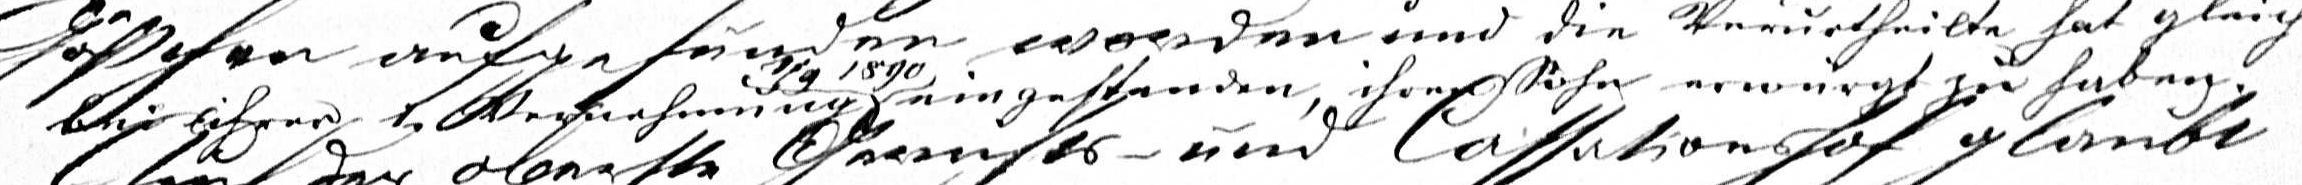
bei ihrer 1. Vernehmung eingestanden, ihren Sohn erwürgt zu haben.
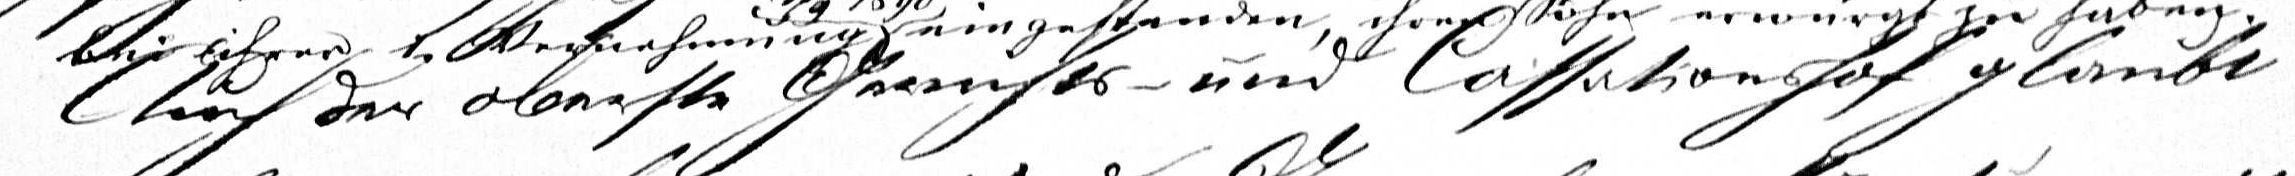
Auch der oberste Gerichts- und Cassationshof glaubt
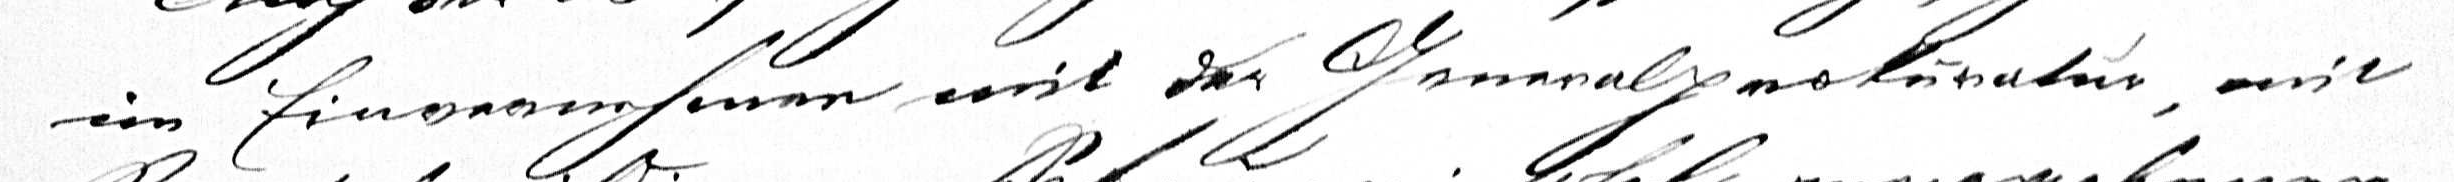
im Einvernehmen mit der Generalprokuratur, mit
